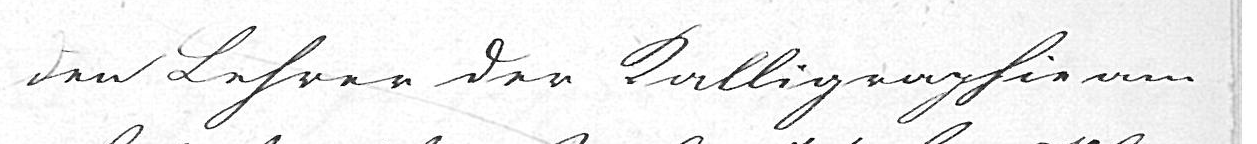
den Lehrer der Kalligraphie am
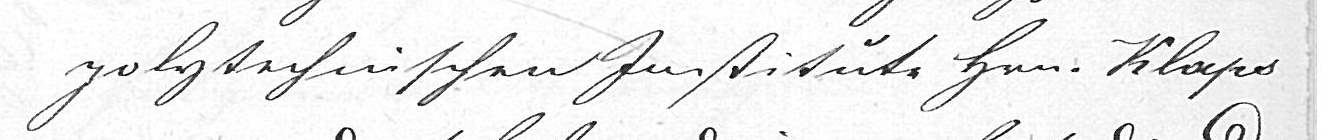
polytechnischen Institute Hrn. Klaps
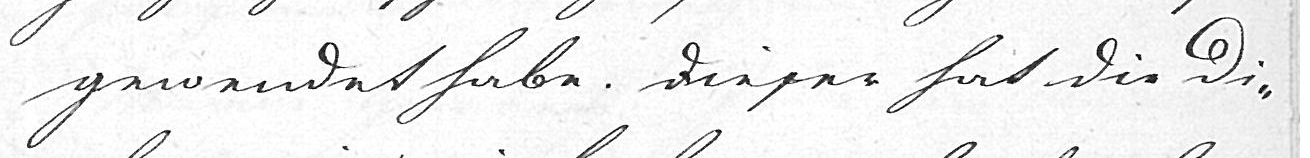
gewendet habe. Dieser hat die Di-
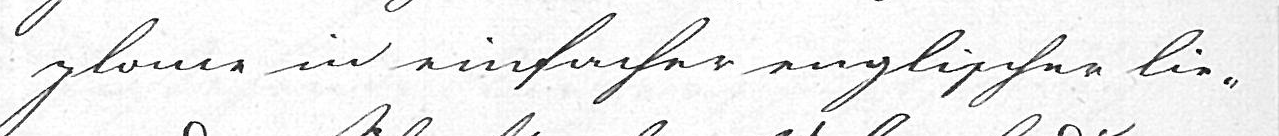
plome in einfacher englischer lie-
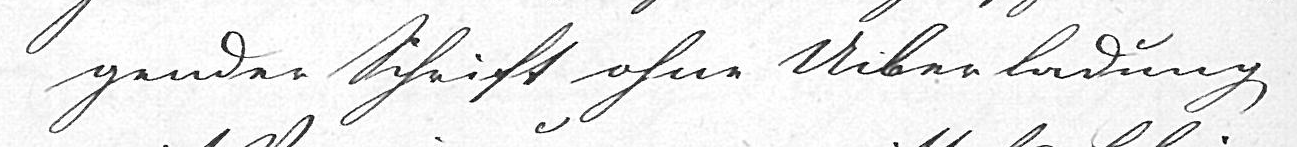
gender Schrift ohne Uiberladung
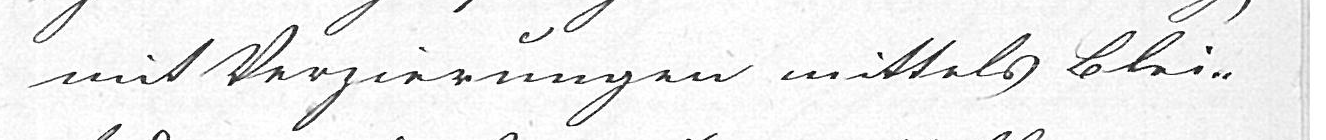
mit Verzierungen mittels blei-
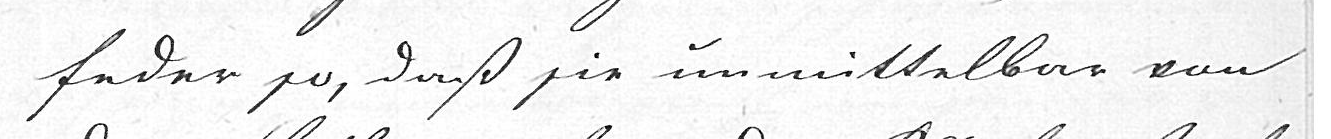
feder so, daß sie unmittelbar von
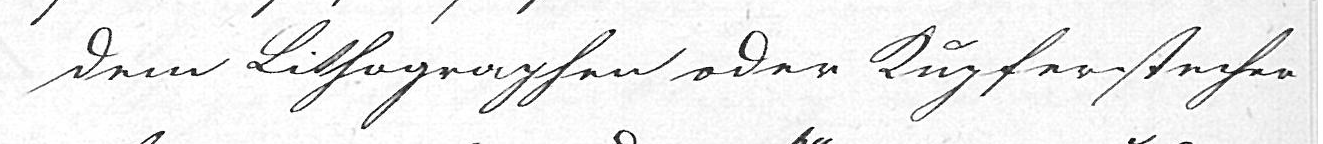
dem Lithographen oder Kupferstecher
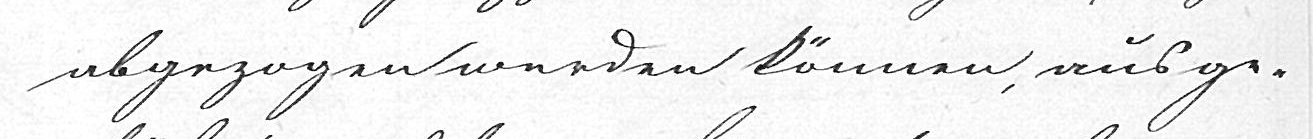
abgezogen werden können, ausge-
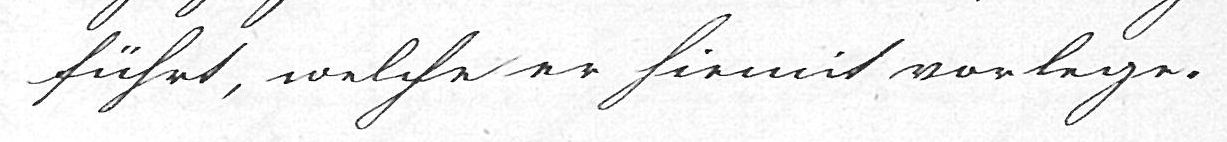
führt, welche er hiemit vorlege.
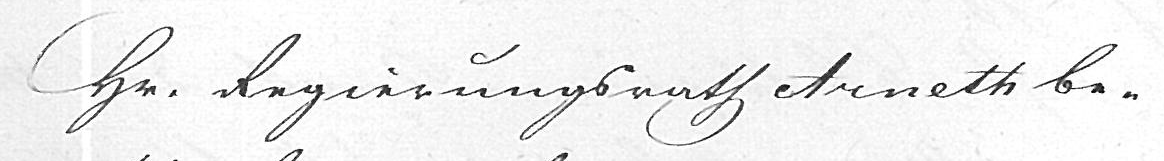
Hr. Regierungsrath Arneth be-
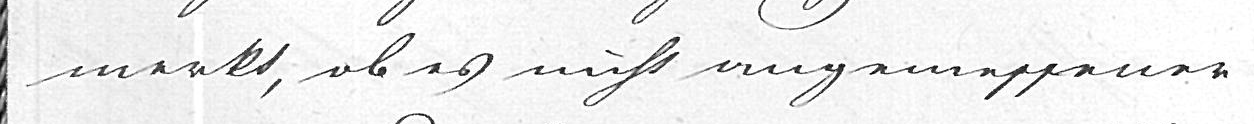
merkt, ob es nicht angemessener
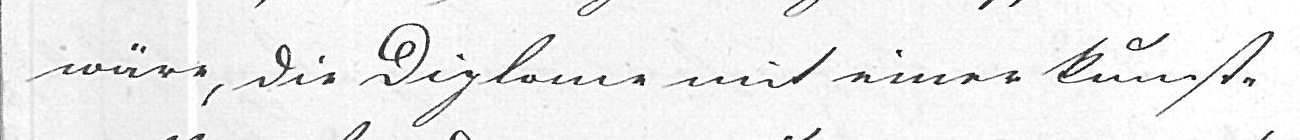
wäre, die Diplome mit einer kunst-
